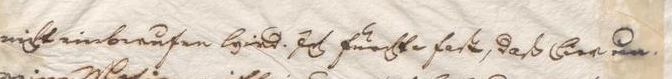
nicht einberufen wird. Ich fürchte fast, daß hier un-
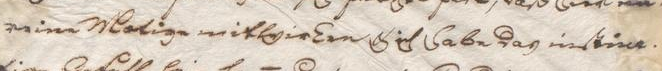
reine Motive mitwirken & ich habe das instinc-
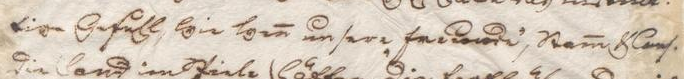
tive Gefühl, wie wenn unsere Freunde, Stamm & Cons.
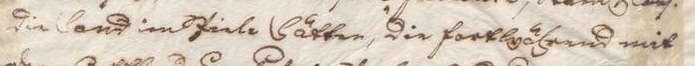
die Hand im Spiele hätten, die fortwährend mit
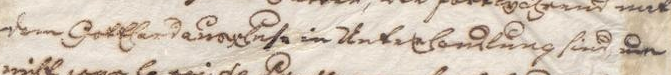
dem Gotthardausschusse in Unterhandlung sind, um
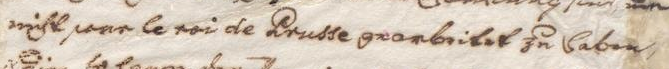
nicht, pour le roi de Prusse gearbeitet zu haben,
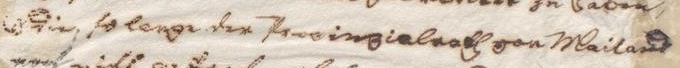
& die, so lange der Provinzialrath von Mailand
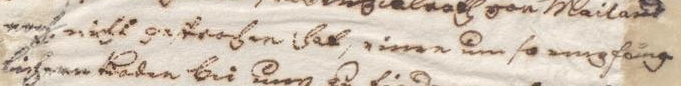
noch nicht gesprochen hat, einen um so empfäng-
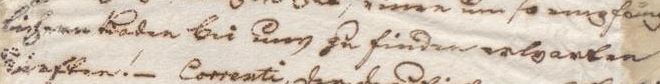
lichern Boden bei uns zu finden erwarten
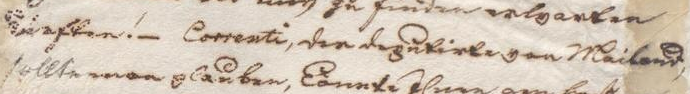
dürften! – Correnti, der Deputirte von Mailand,
